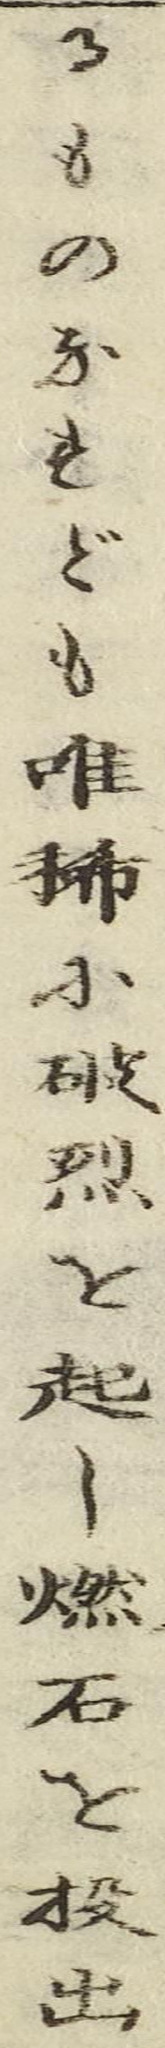るものなれども唯稀に破烈を起し燃石を投出
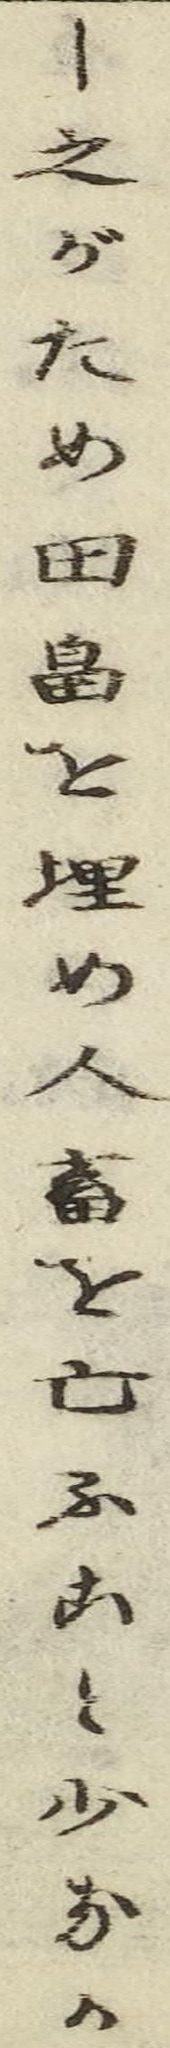し之がため田畠を埋め人畜を亡ふこと少なか
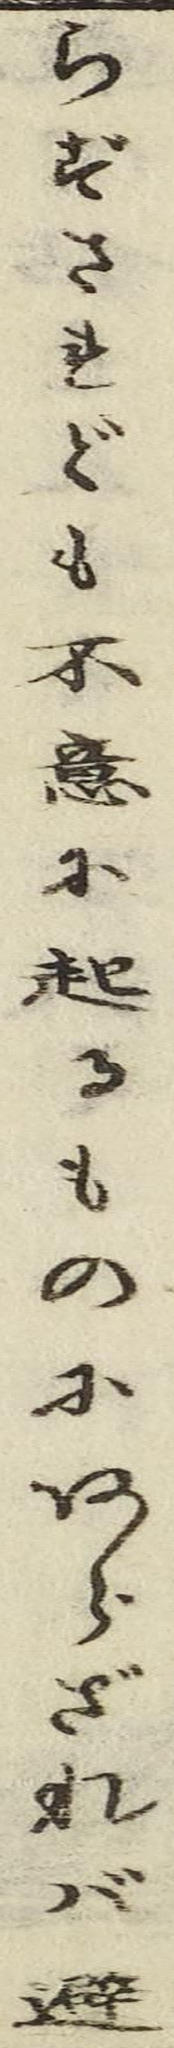らずされども不意に起るものにあらざれば避
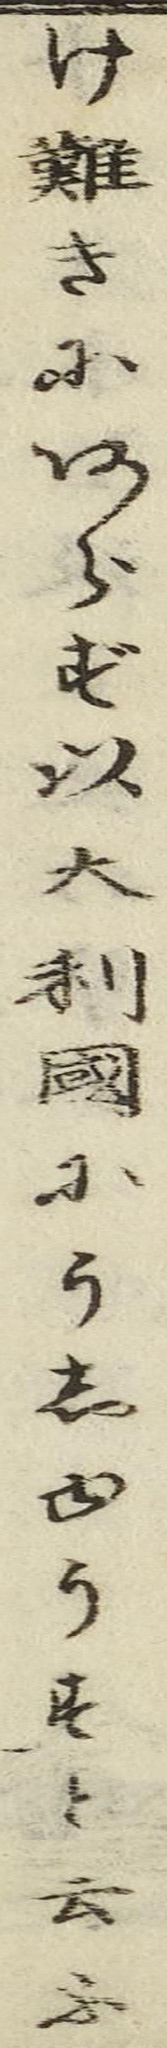け難きにあらず以大利国に「うしゆうす」と云ふ
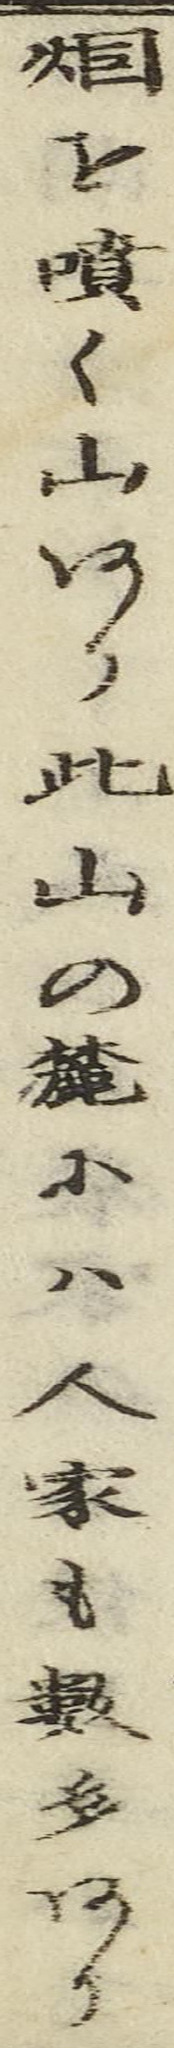煙を噴く山あり此山の麓には人家も数多あり
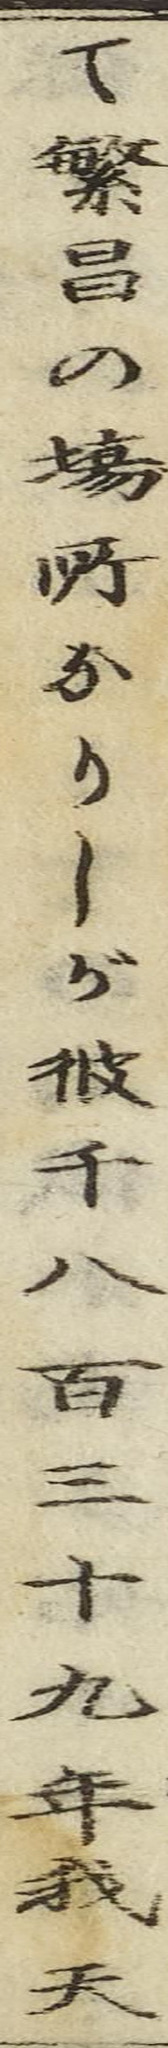て繁昌の場所なりしが彼千八百三十九年我天

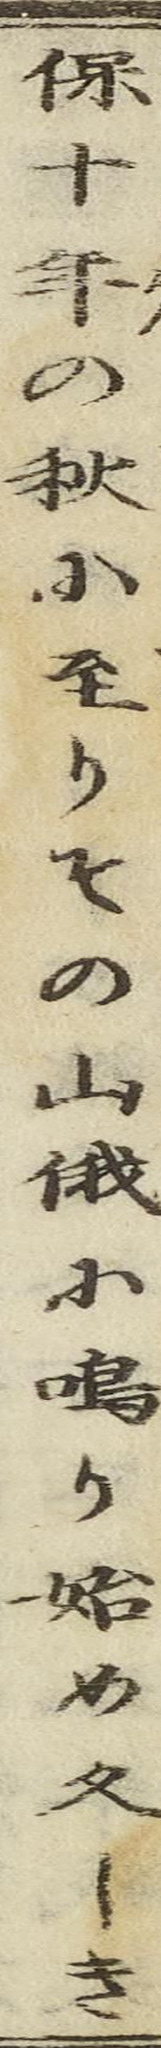保十年の秋に至りその山俄に鳴り始め久しき
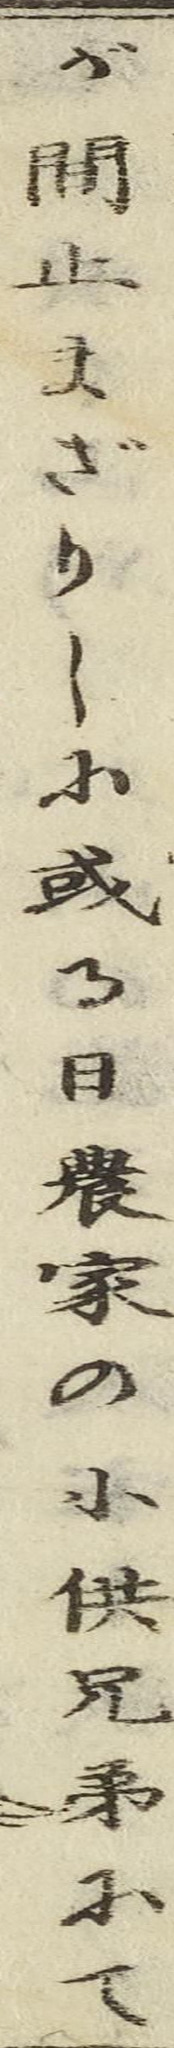が間止まざりしに或る日農家の小供兄弟にて
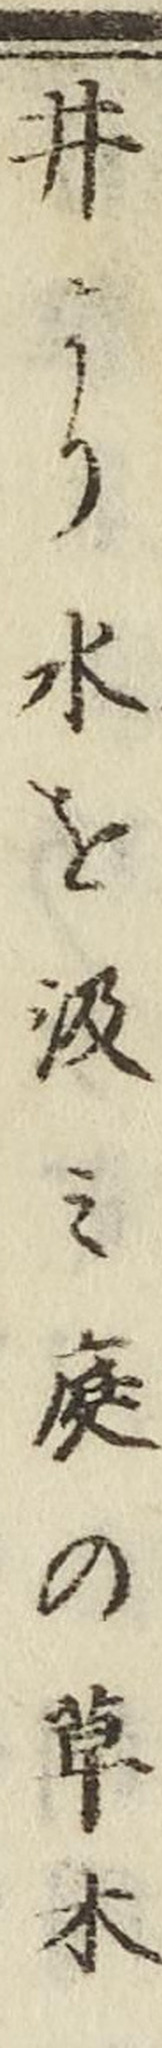井より水を汲み庭の草木
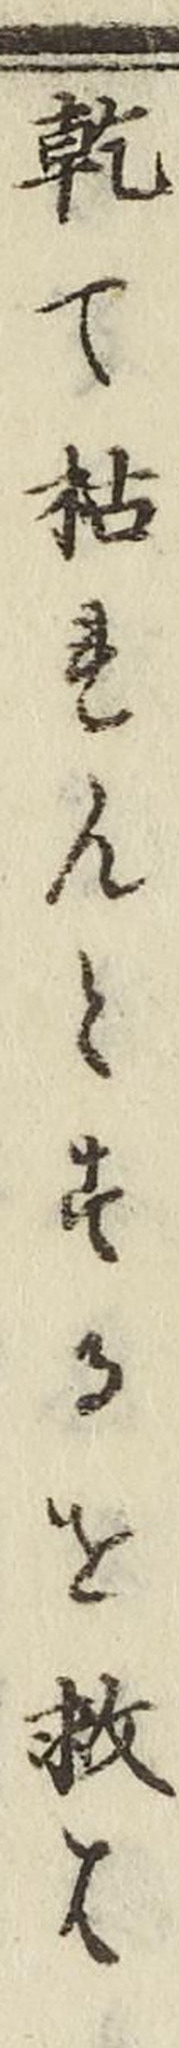乾て枯れんとするを救は
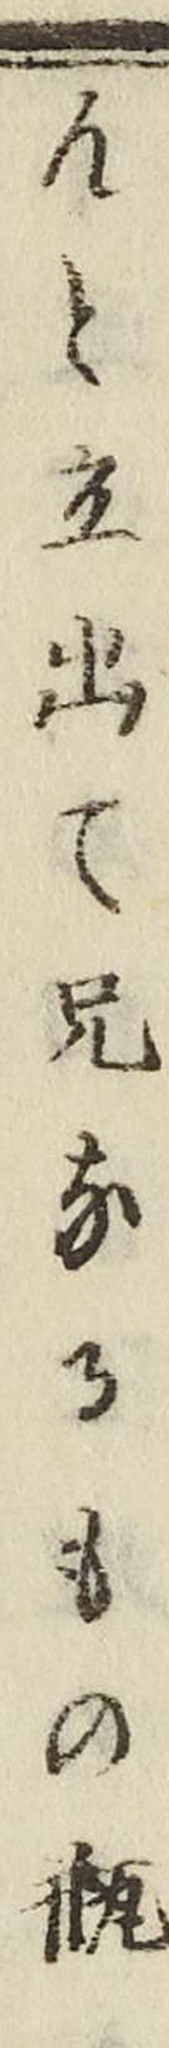んと立出て兄なるもの瓶
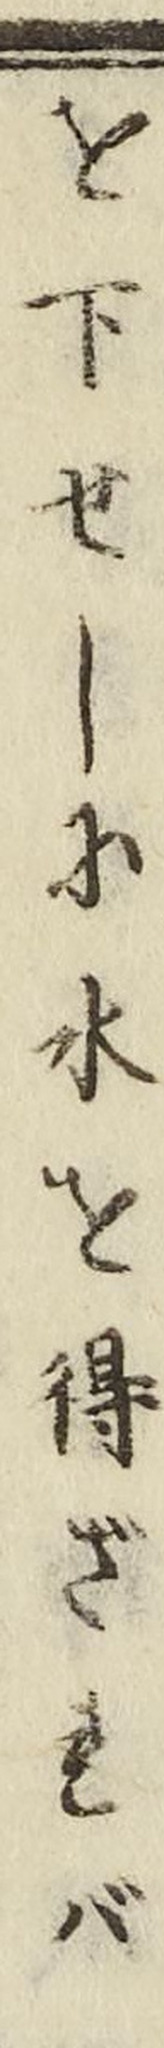を下せしに水を得ざれば
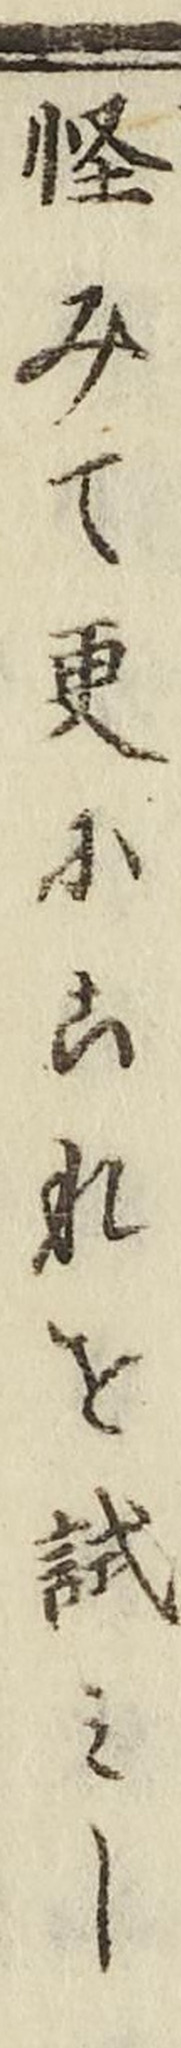怪みて更にこれを試みし
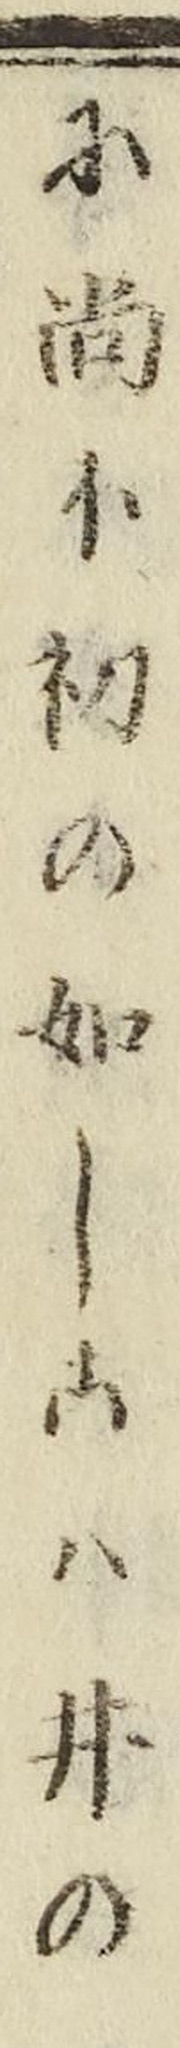に尚ほ初の如しこは井の
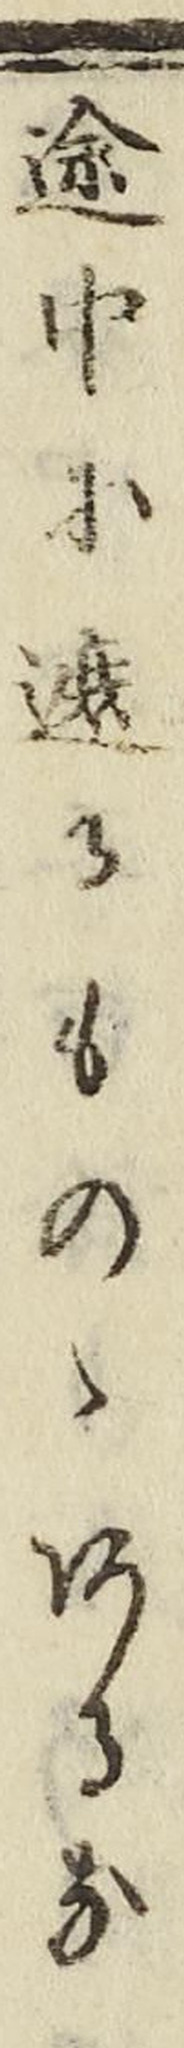途中に遮るものゝあるな
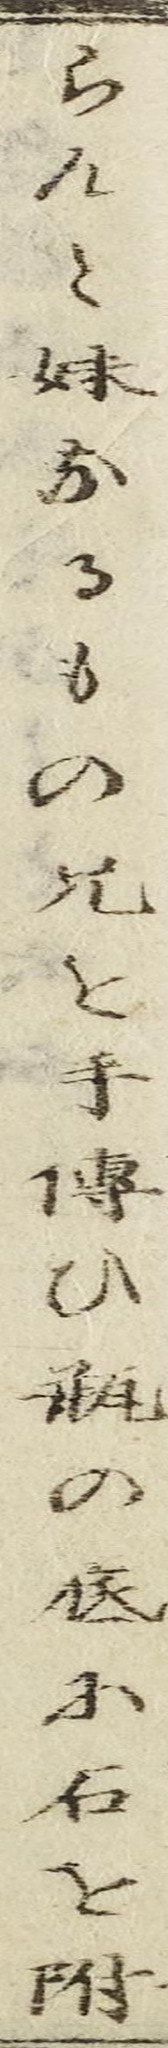らんと妹なるもの兄を手伝い瓶の底に石を附
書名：天変地異
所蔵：東京大学地震研究所図書室 Earthquake Research Institute Library, The University of Tokyo, JAPAN
